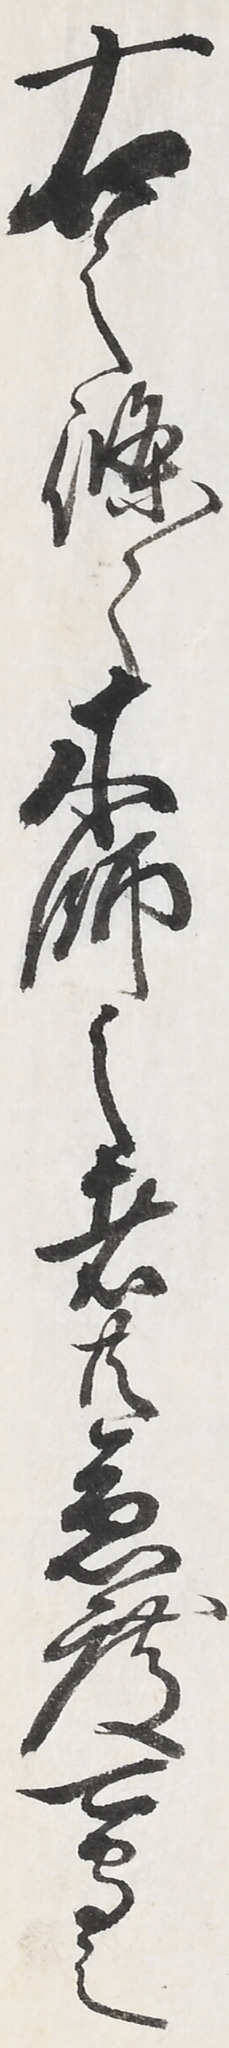右之條々木師之者共急度可守之
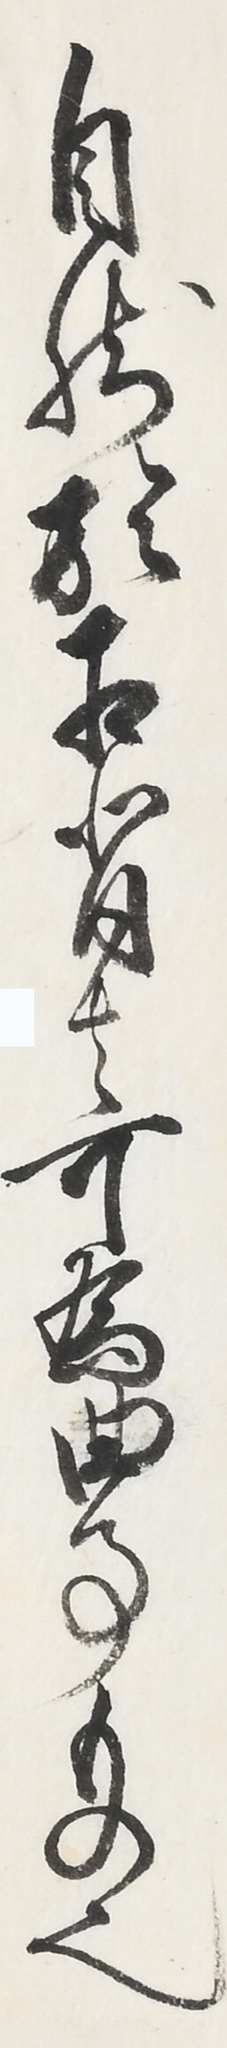自然於相背者可為曲事もの也
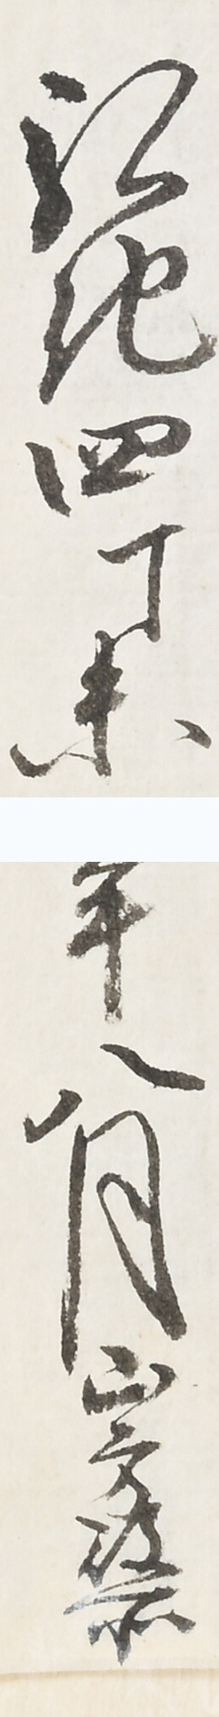弘化四丁未年八月山方役所
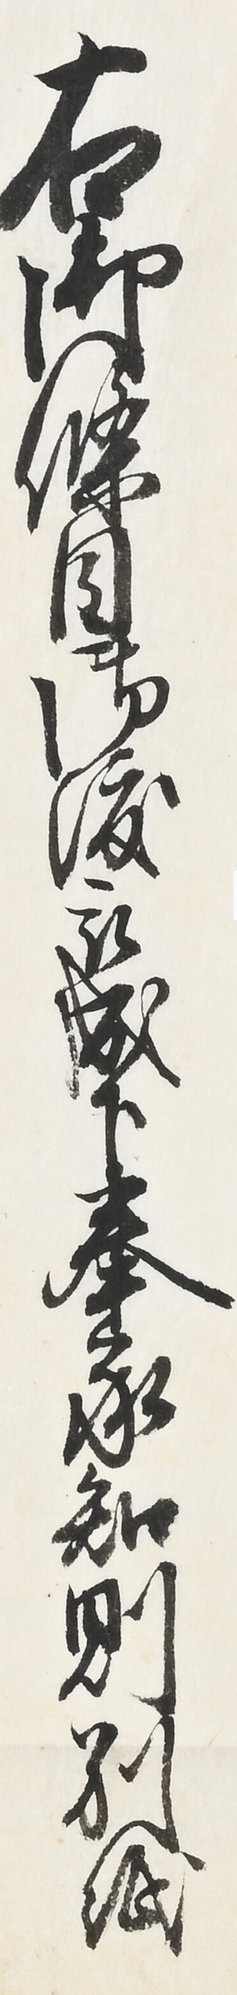右御條目御渡被成下奉承知則別紙
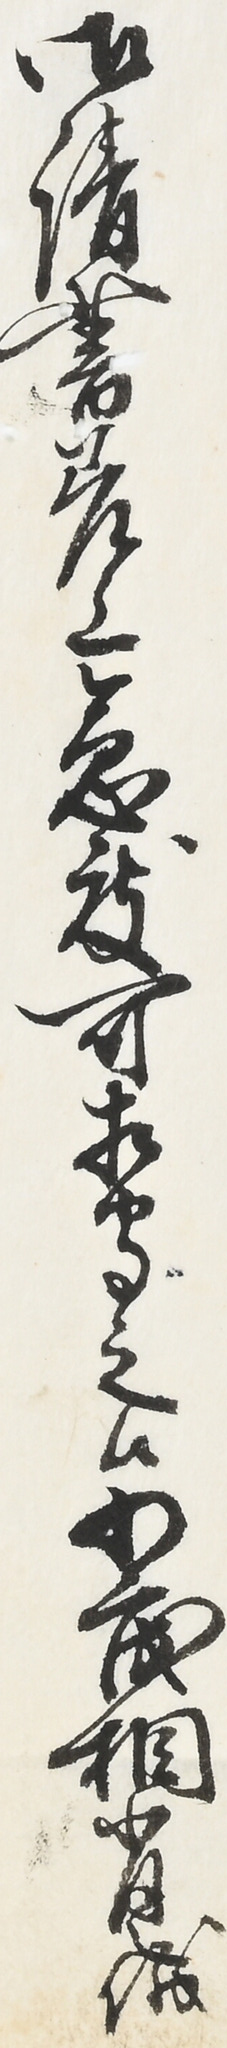請書差上急度可相守之候少茂相背儀

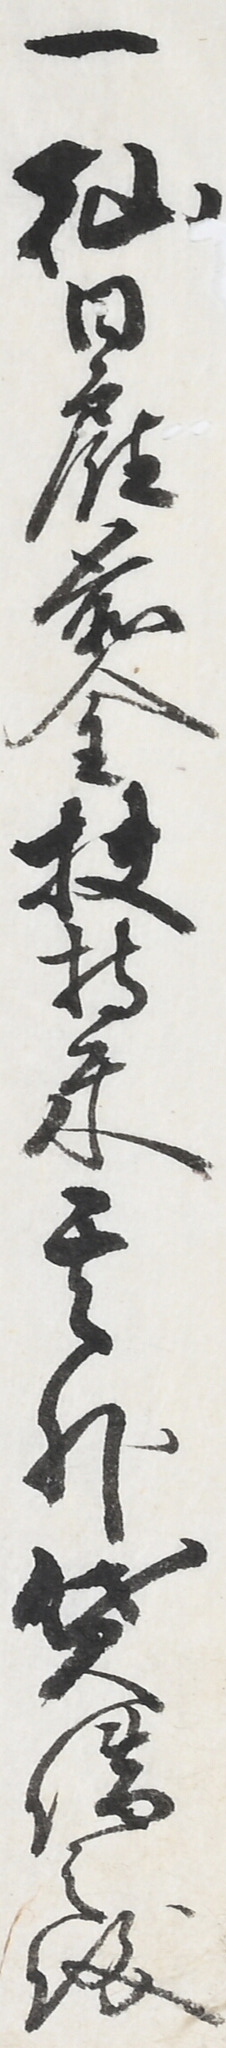一杣日雇前金扶持米其外貸借之儀
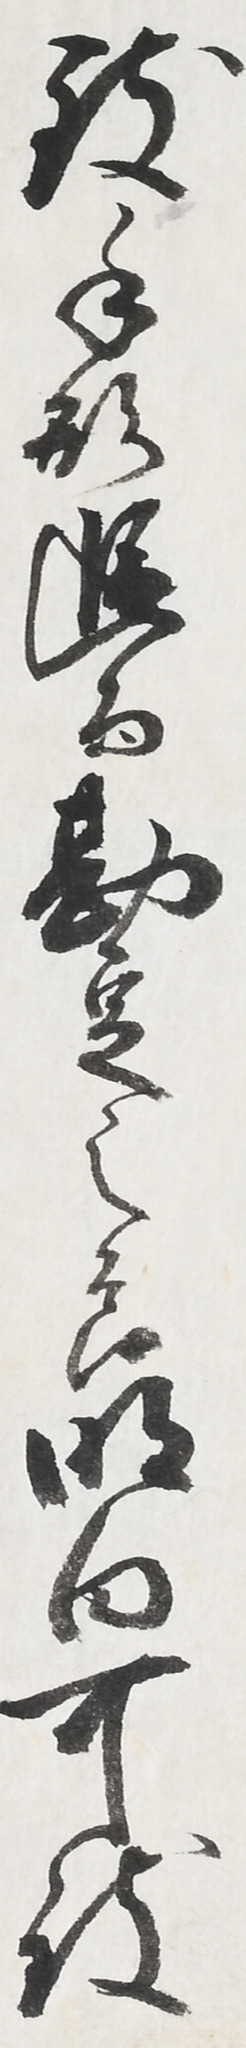致手形追而勘定之節明白可致
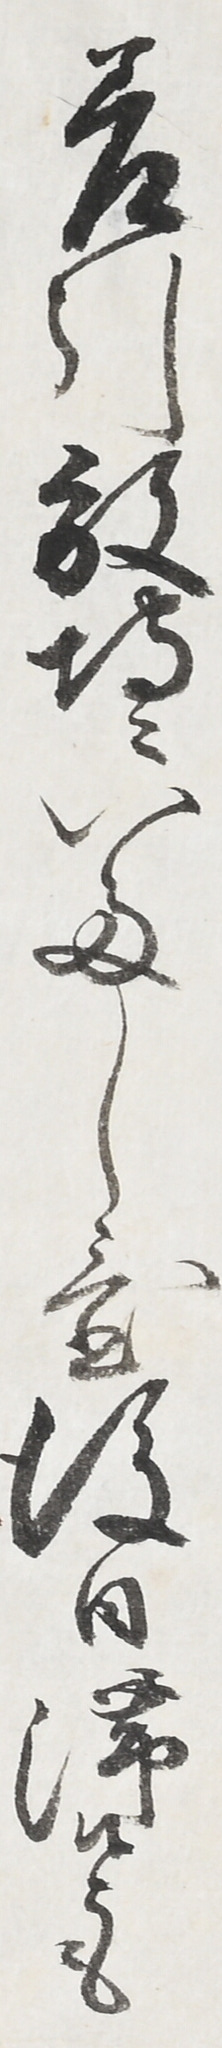差引放埒ニいたし置後日滞候とも
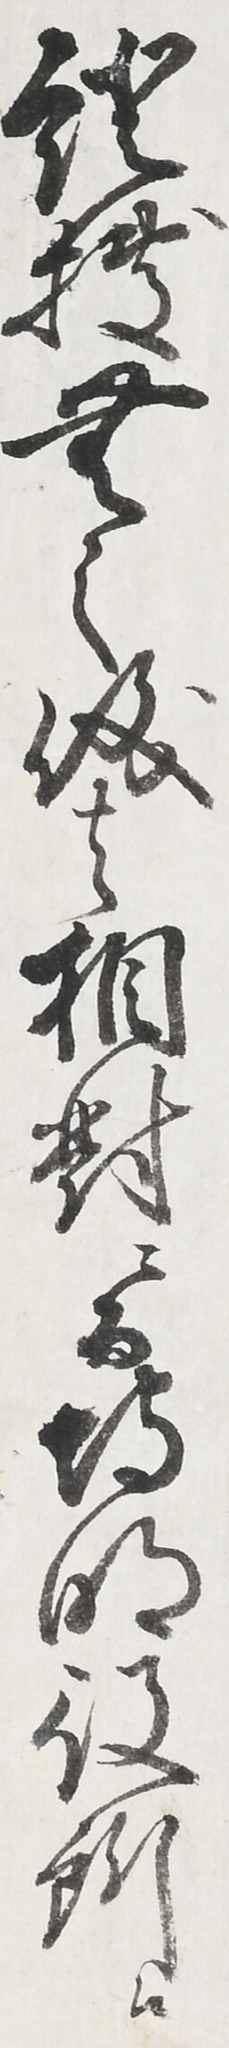証拠無之儀者相対ニ而埒明役所江
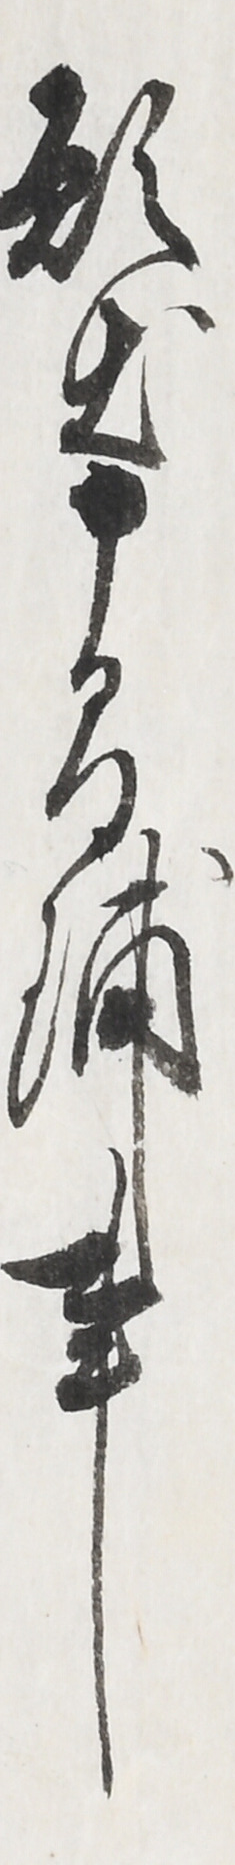願出申間敷事
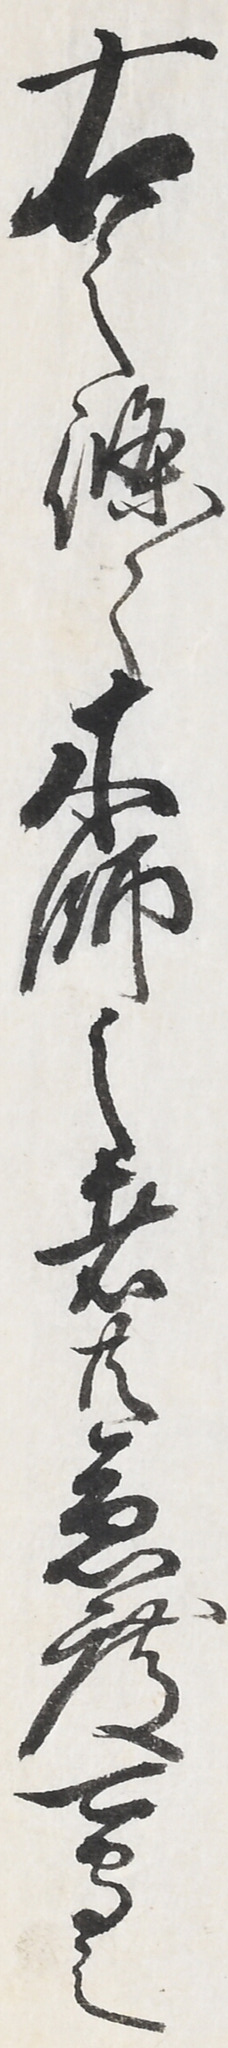右之條々木師之者共急度可守之
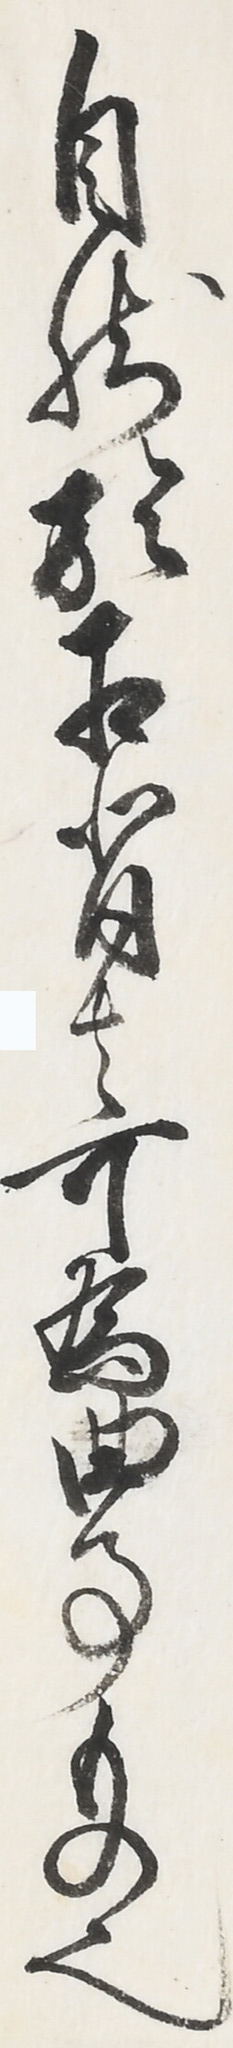自然於相背者可為曲事もの也
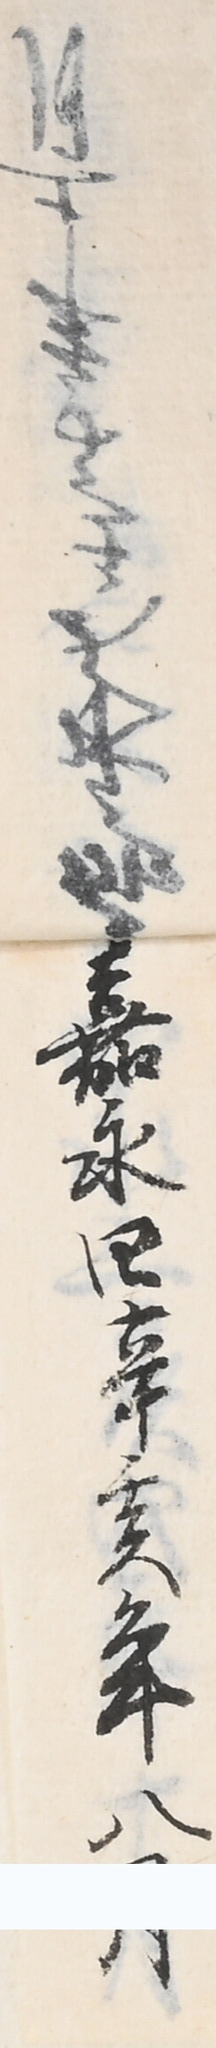嘉永四辛亥年八月
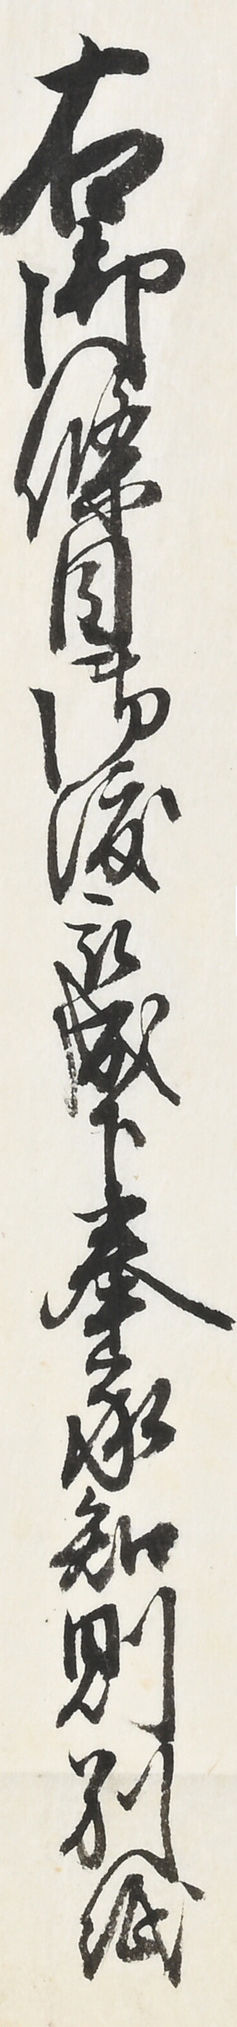右御條目御渡被成下奉承知則別紙
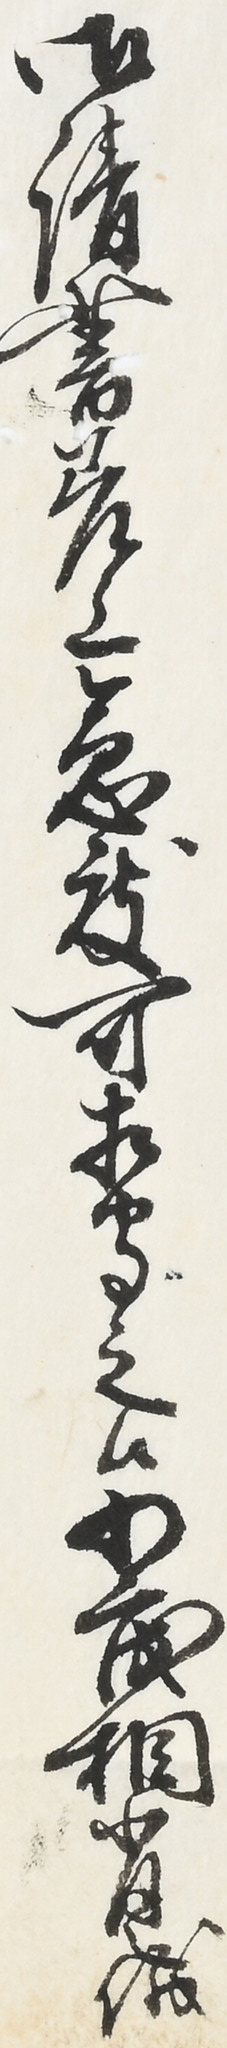請書差上急度可相守之候少茂相背儀

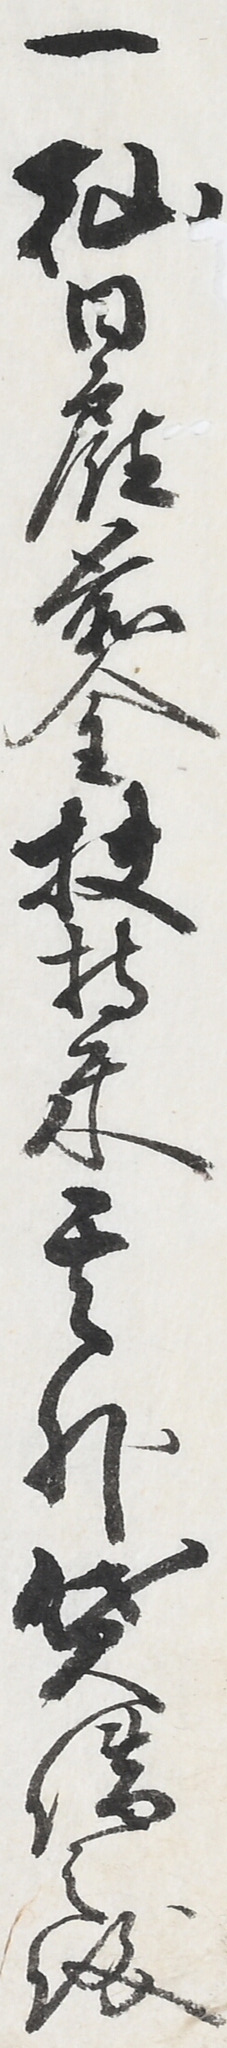一杣日雇前金扶持米其外貸借之儀
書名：小白木條目請書并判取帳
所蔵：伊那市立高遠町図書館・合同会社AMANE
